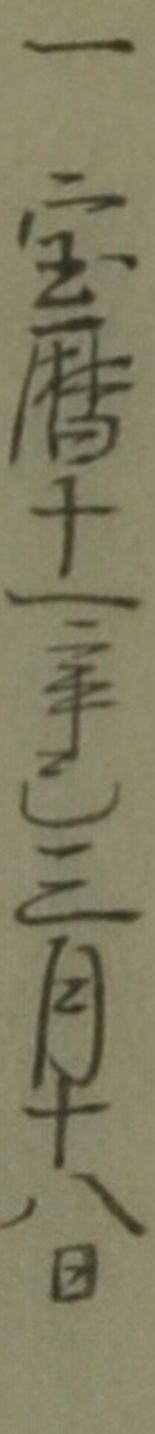一宝暦十一辛巳三月十八日
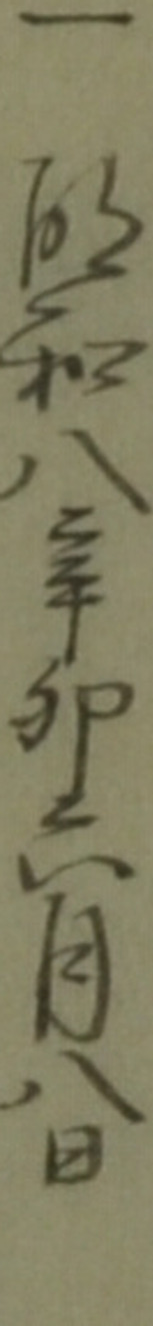一明和八辛卯六月八日
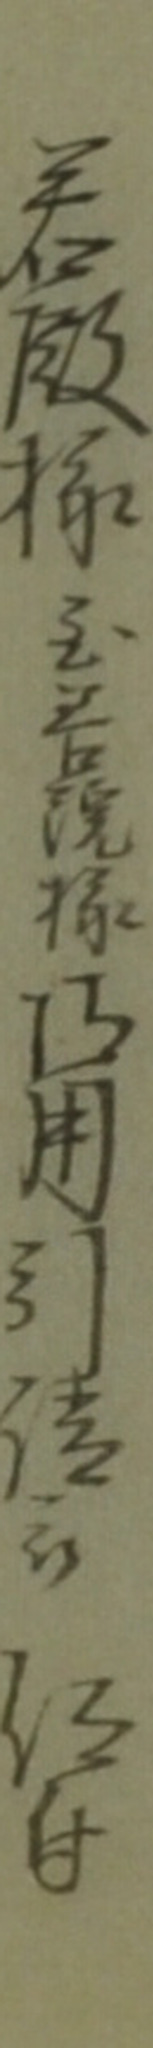若殿様至善院様御用引請被仰付
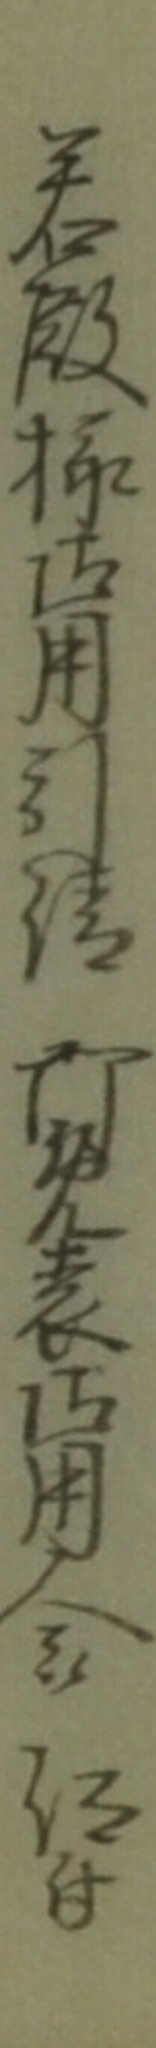若殿様御用引請御免表御用人被仰付
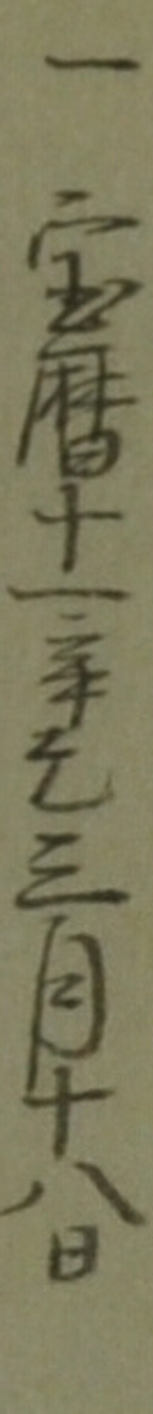一宝暦十一辛巳三月十八日
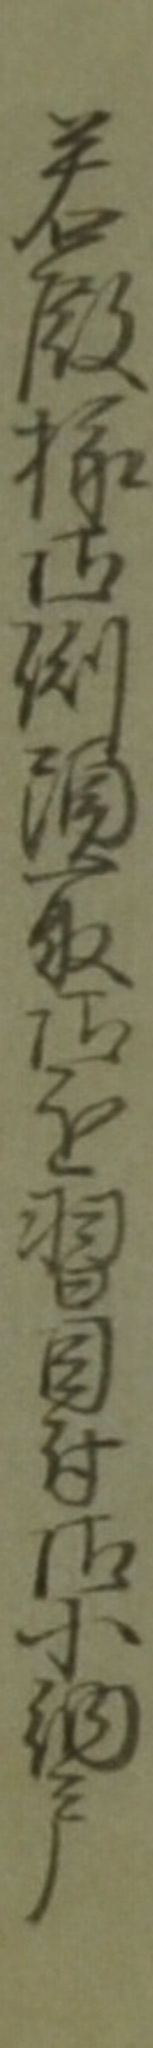若殿様御側頭取御近習目付御小納戸
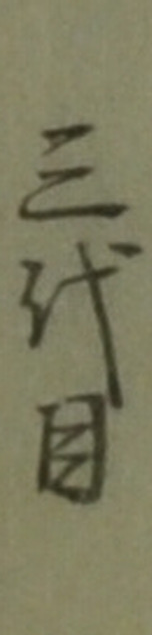三代目
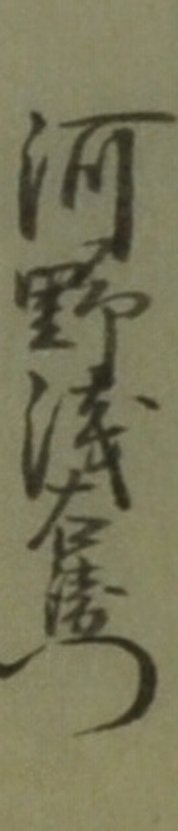河野浅右衛門
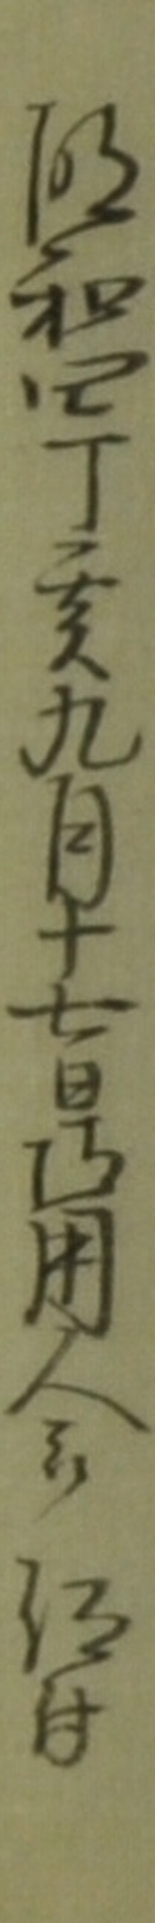一明和四丁亥九月十七日御用人被仰付
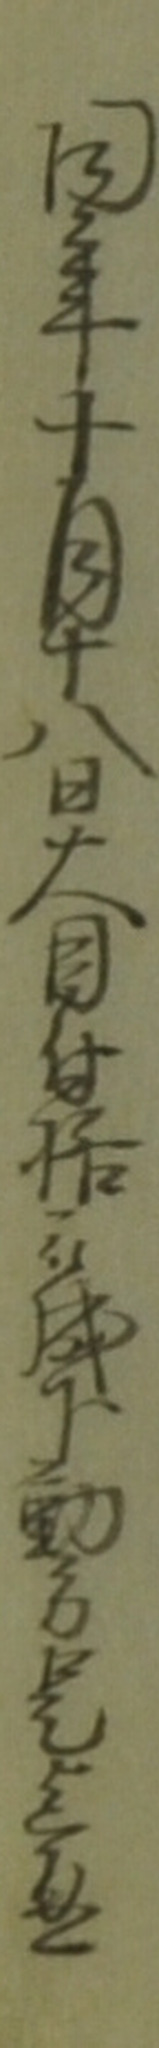一同年十月十八日大目付格被成下勤方是迄通
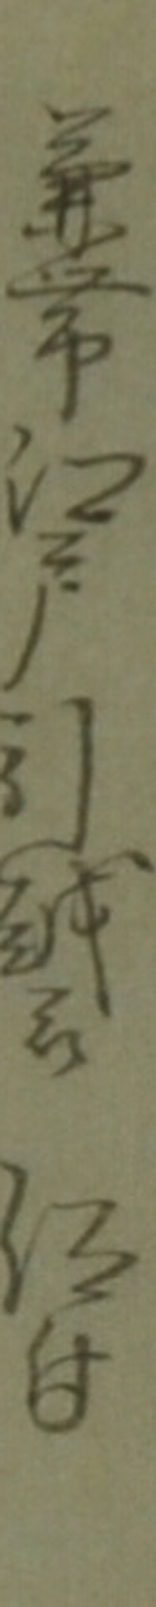兼帯江戸引越被仰付
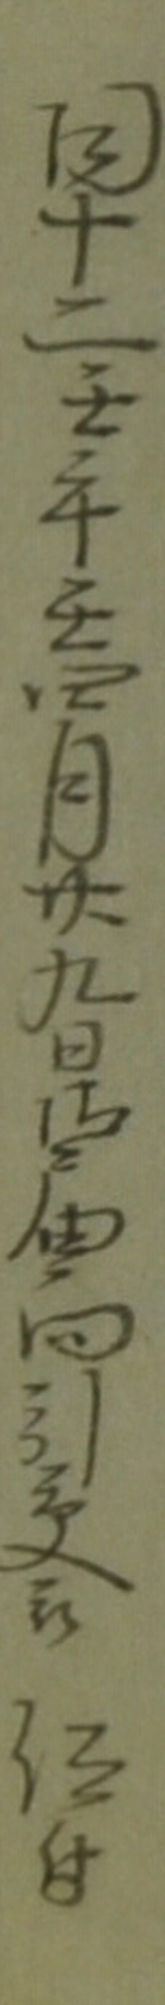一同十二壬午閏四月廿九日御届向引受被仰付

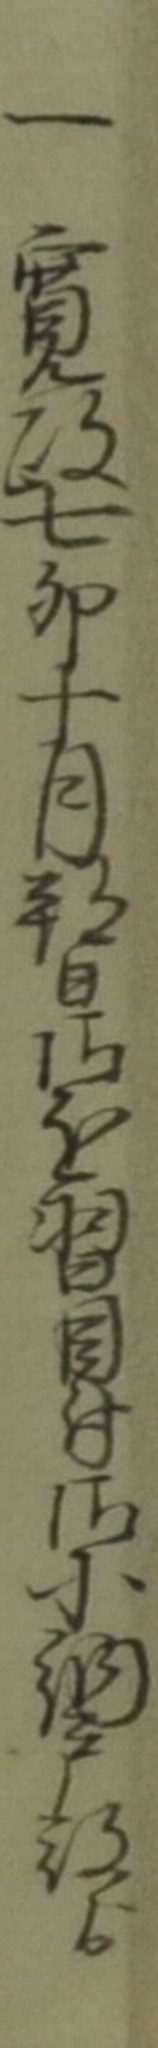一寛政七卯十月朔日御近習目付御小納戸役ゟ
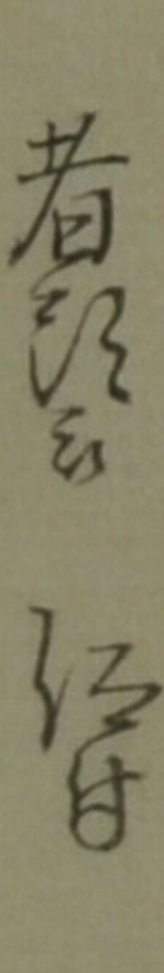者頭被仰付
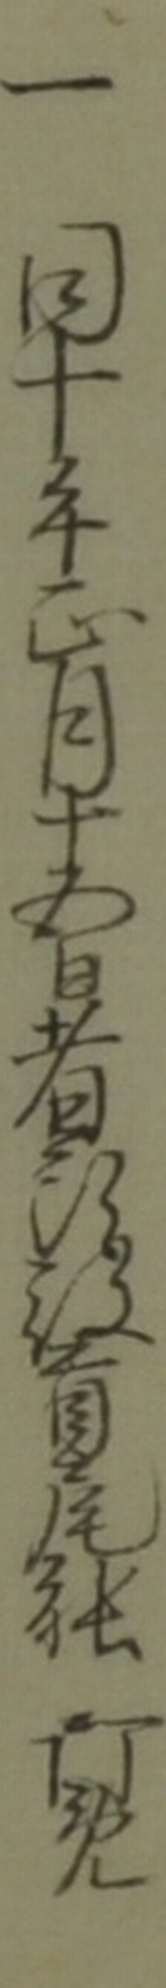一同十午正月十五日者頭役首尾能御免
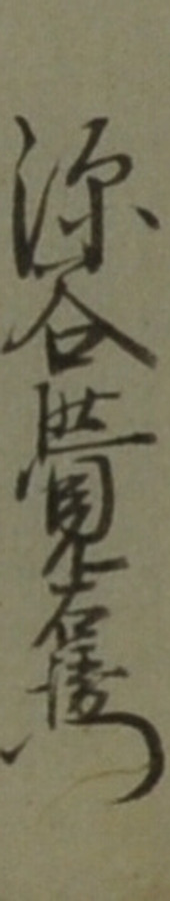深谷覚右衛門
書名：諸御役代々録（二）
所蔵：伊那市立高遠町図書館・合同会社AMANE
